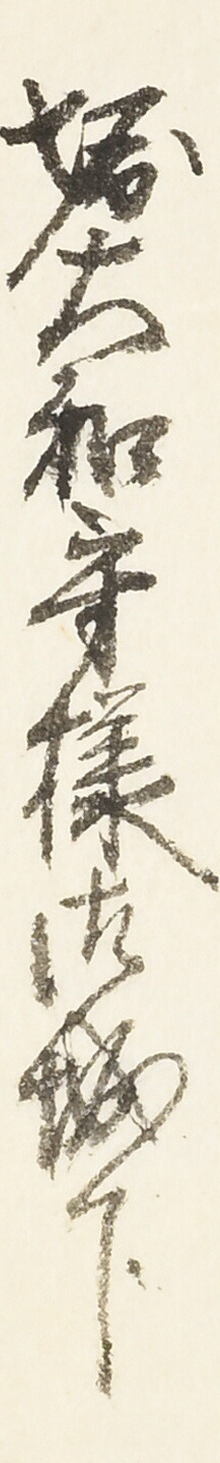堀大和守様御城下
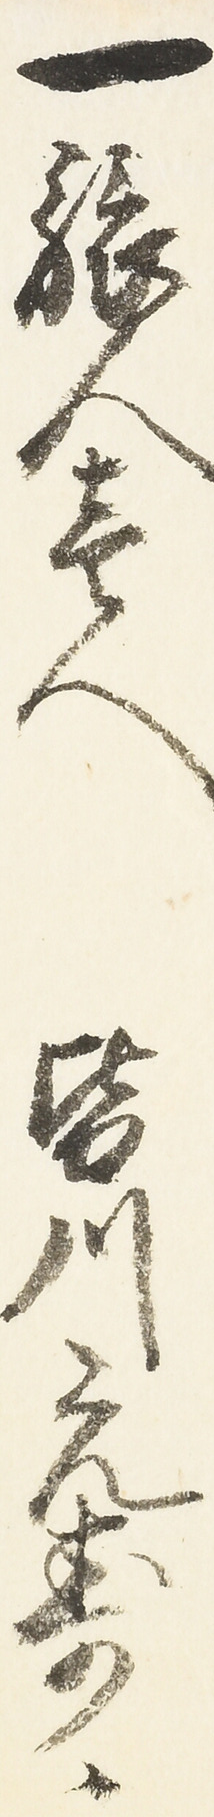一旅人壱人皆川元寿・
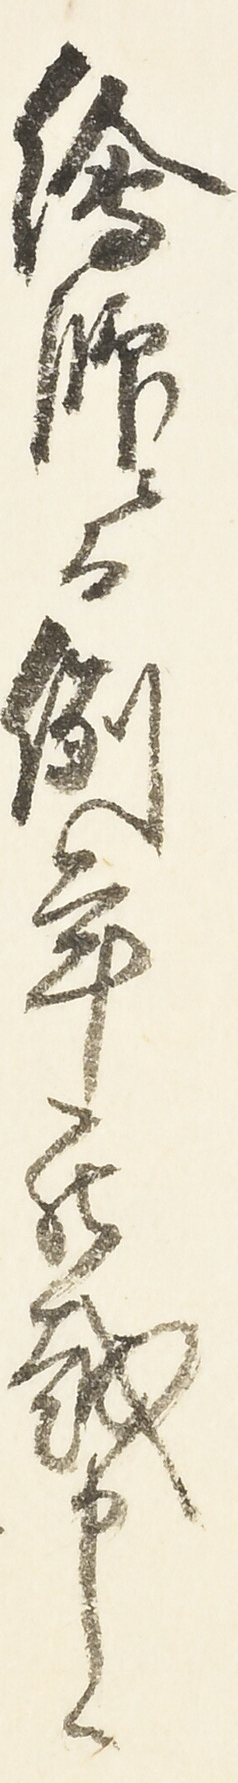絵師ニ而例年罷越申候
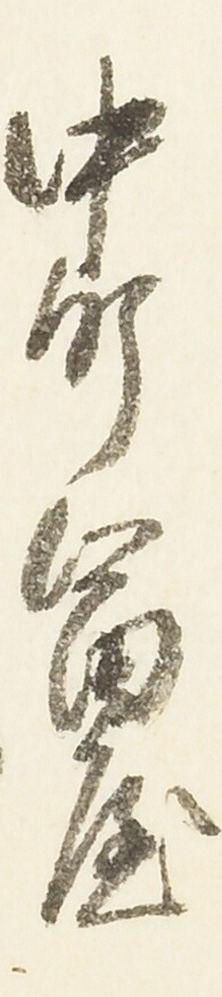中町冨屋
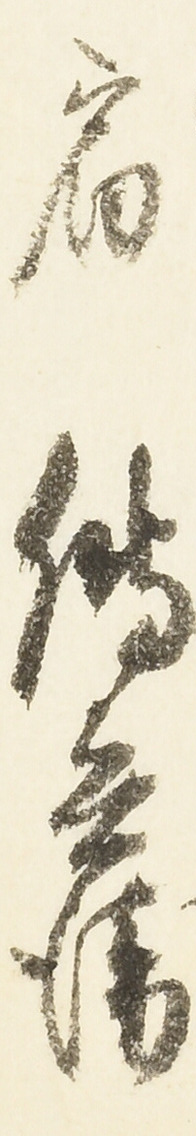宿伝兵衛
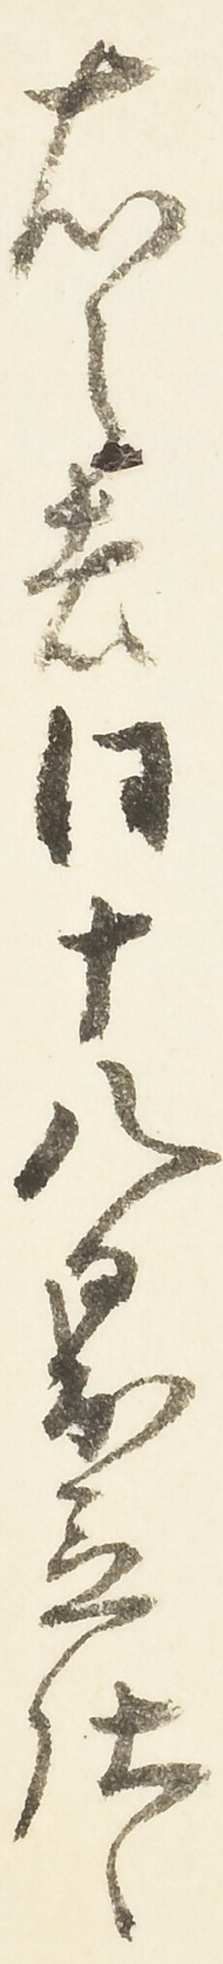右之者同十八日出立仕候
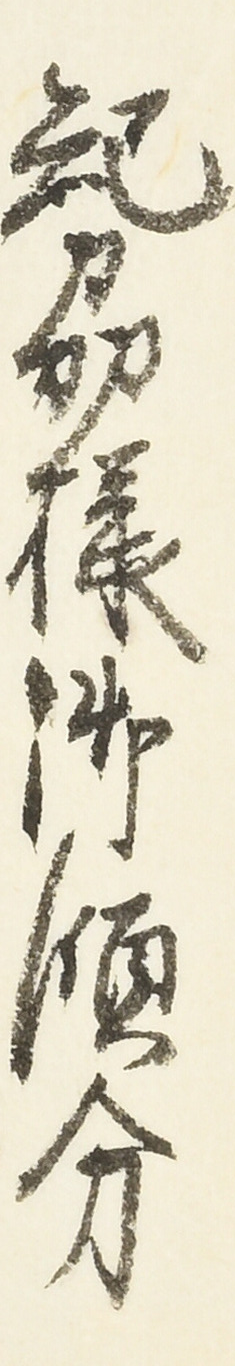紀州様御領分
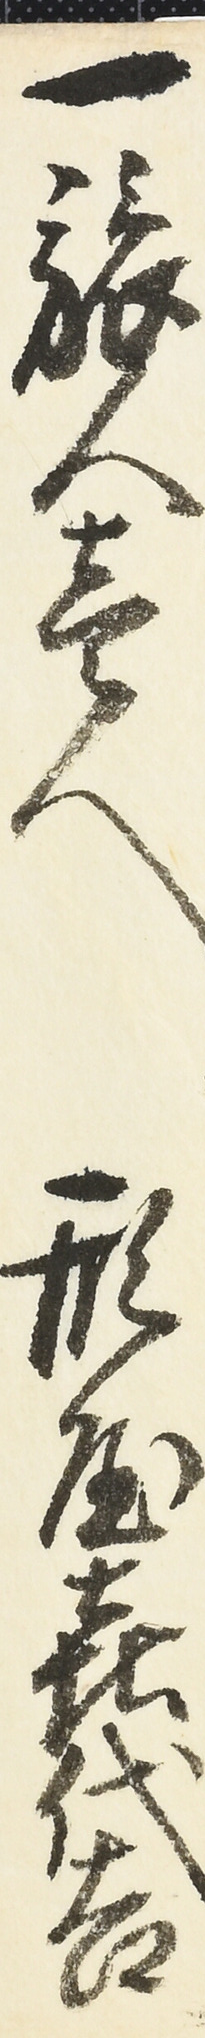一旅人壱人形屋喜代吉・
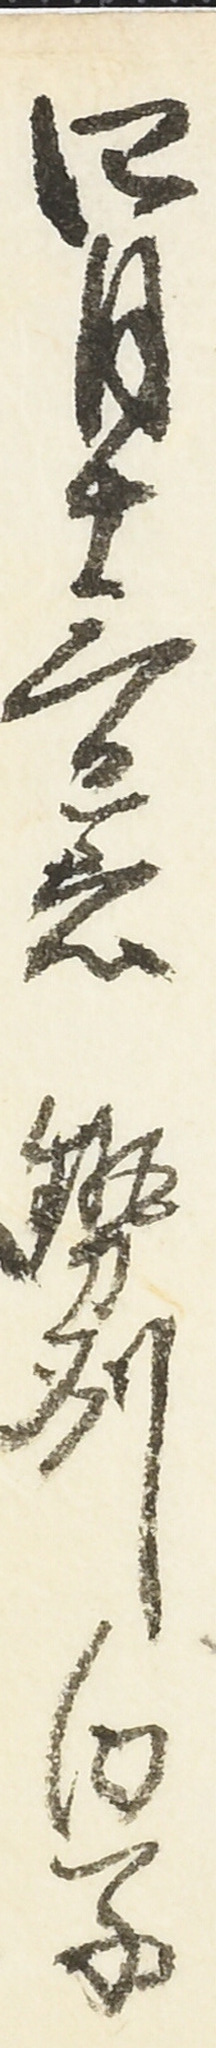四月十三日着勢州白子
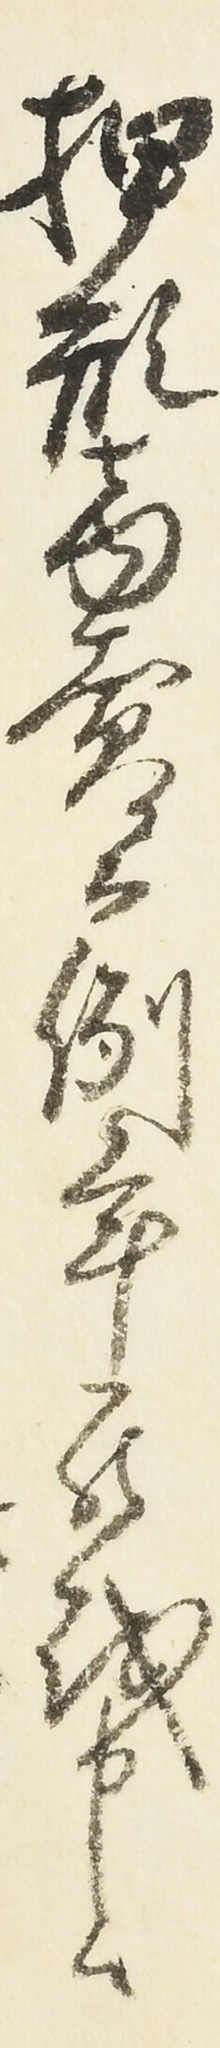押形商売ニ而例年罷越申候
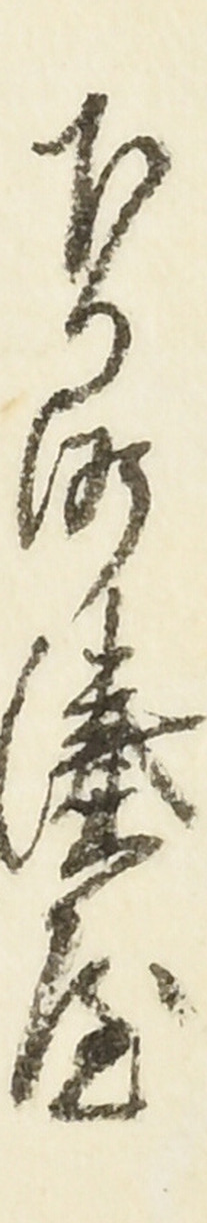下リ町湊屋
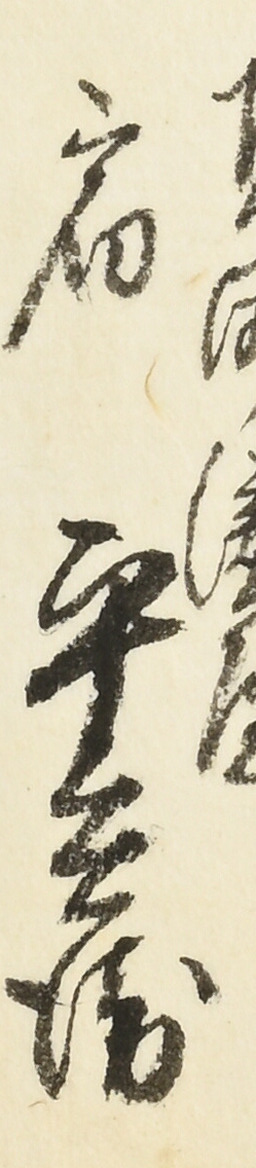宿平兵衛
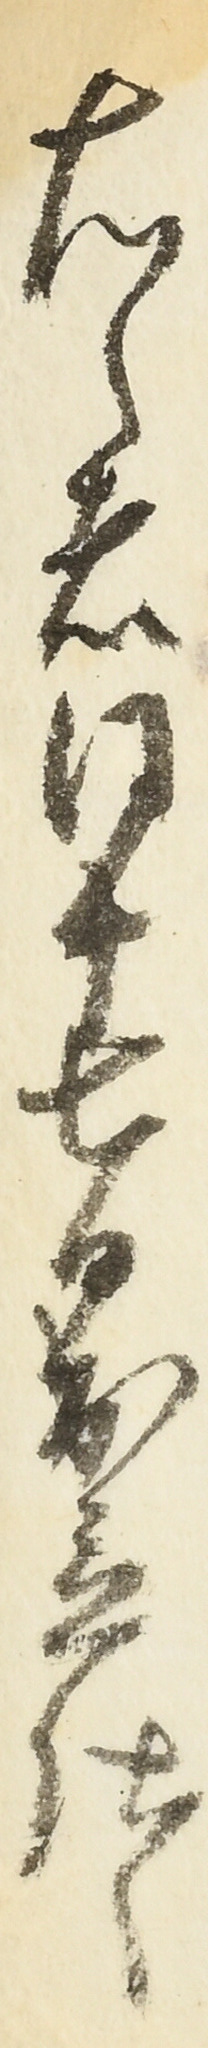右之者同十七日出立仕候

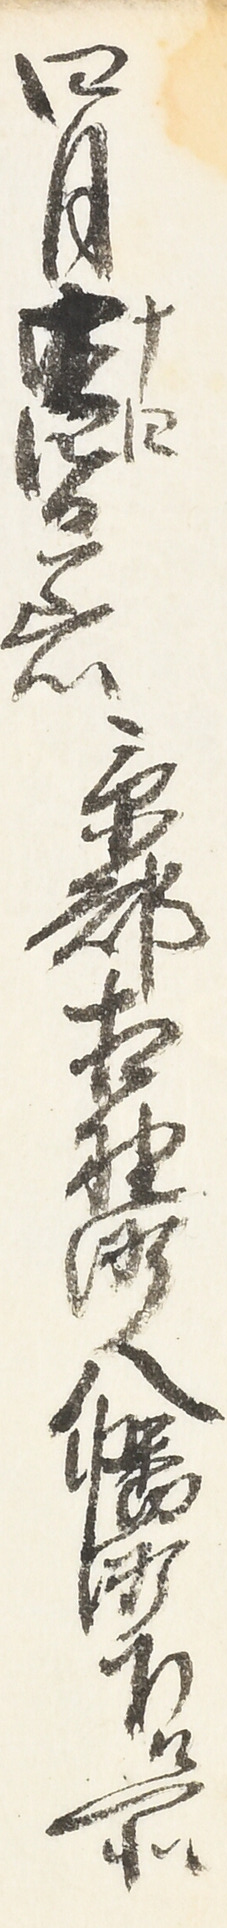四月十四日着京都相野町八幡町下ル所
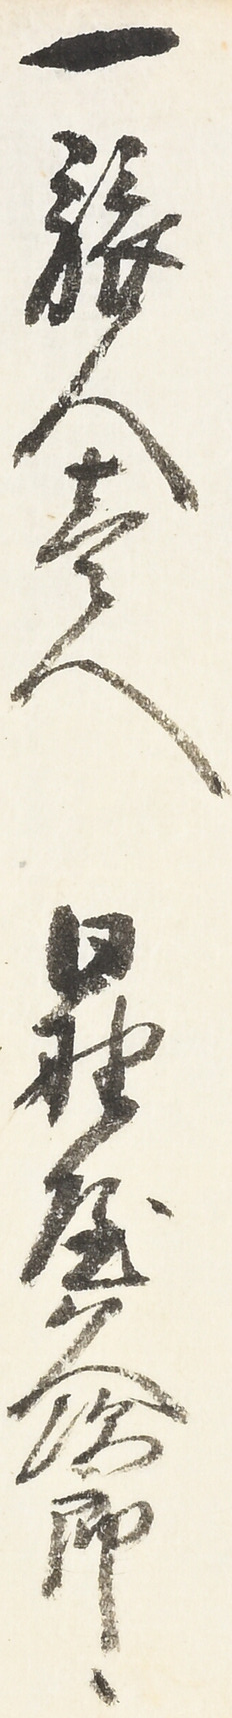一旅人壱人日野屋久次郎・
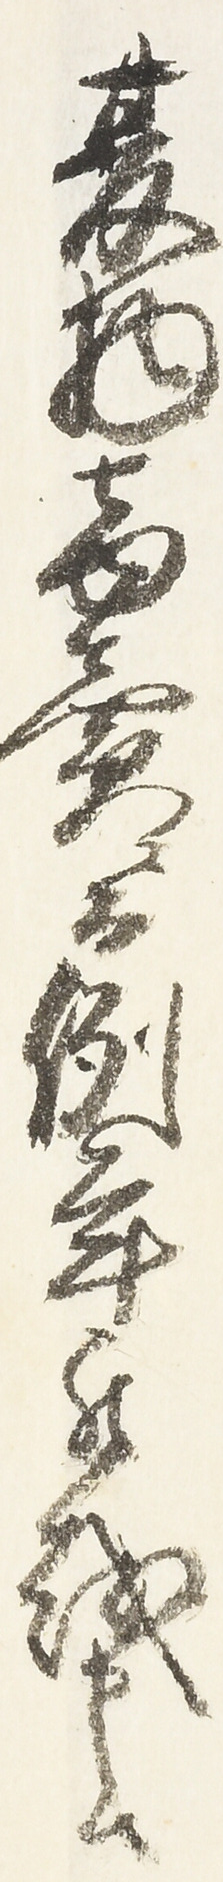夏物商売ニ而例年罷越申候
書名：町中旅人泊控帳
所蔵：伊那市立高遠町図書館・合同会社AMANE
